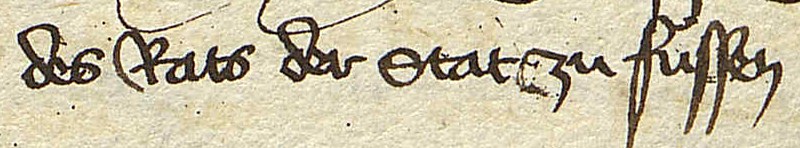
des Rats der Stat cʒu Füſſen
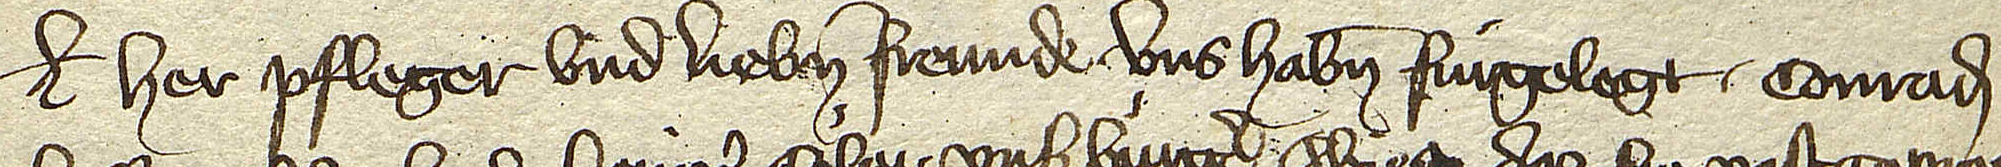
L* her pfleger vnd liebn* freunde / vns habn* fürgelegt / Conrad*
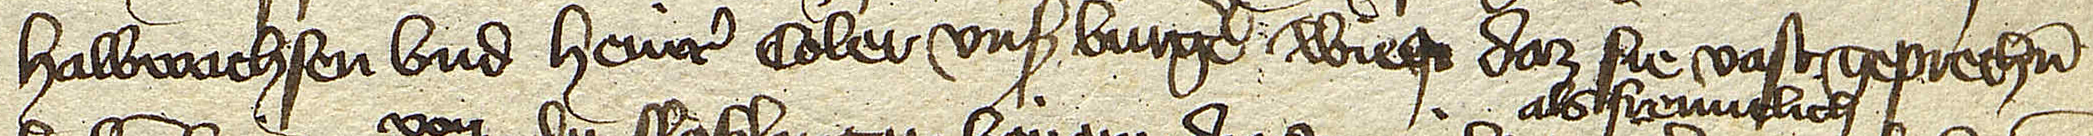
halbwachſen vnd heinr* Cöler vnſ* bürge* / wie Ir daʒ ſie vaſt geprechn*
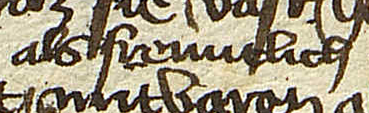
als freuntlich
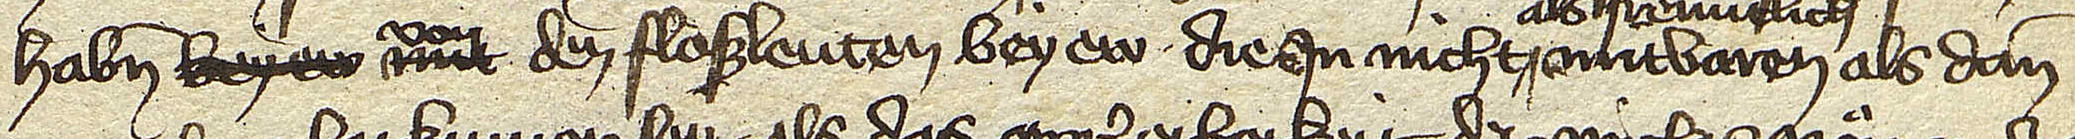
habn* bey ew mit den floſʒleuten bey ew / die In nicht mitvaren als dan*
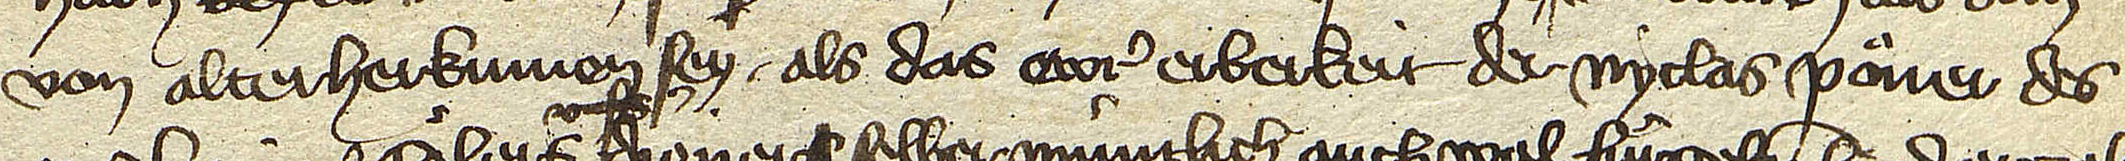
von alterherkumen ſey / als das ewr* erberkeit der Nyclas Pöner des
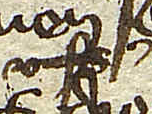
vnſ*s
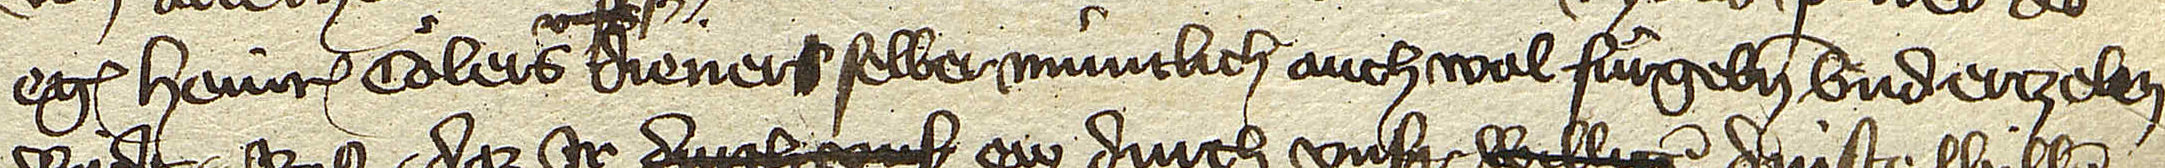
eg* heinr* Cölers dieners ſelber müntlich auch wol fürgebn* vnd ercʒelen
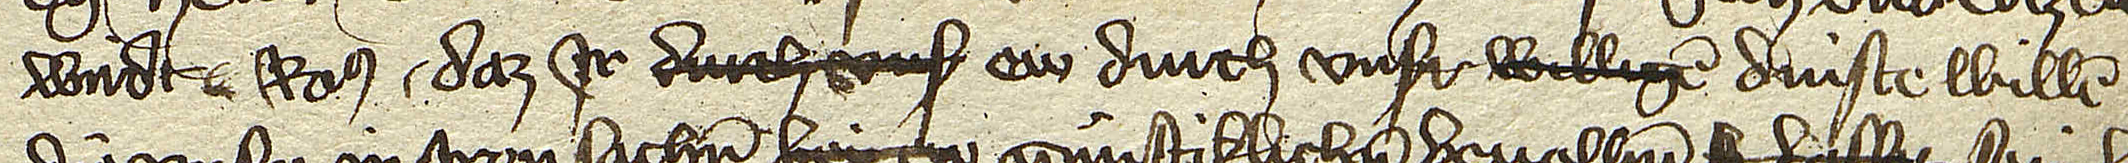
wirdt / Ro* daʒ Ir durch vnſ* ew durch vnſ*r willige* dinſte wille*
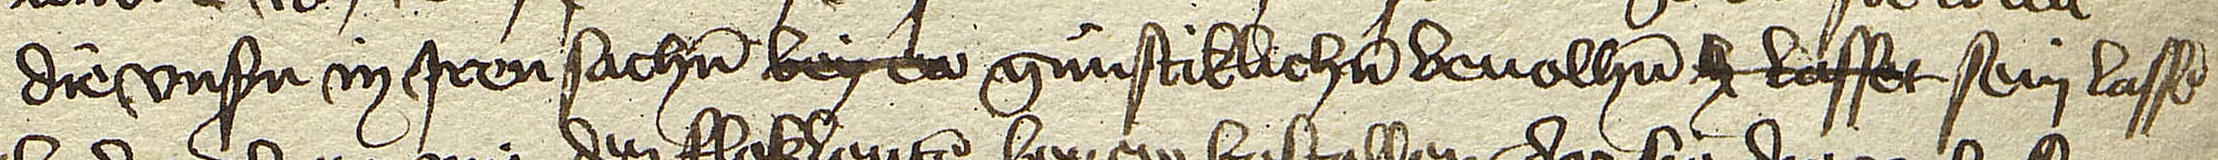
die vnſ*n in Iren ſachn* bey ew günſtiklichn* beuolhn* h laſſet ſein laſſe*
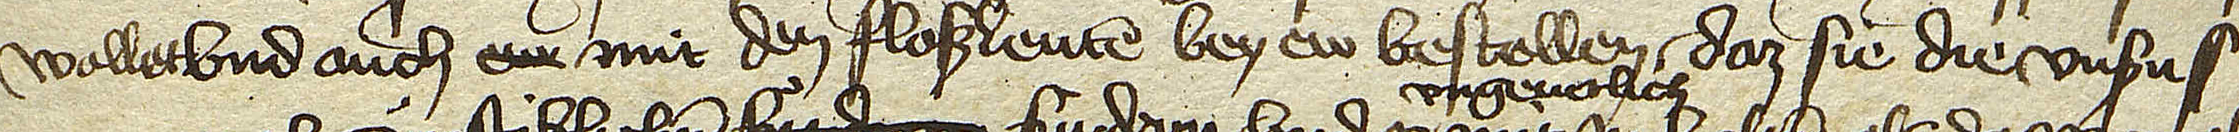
wollet vnd auch ew mit den floſʒleute* bey ew beſtellen / daʒ ſie die vnſ*n ſ
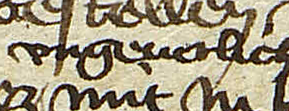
vngeuerlich
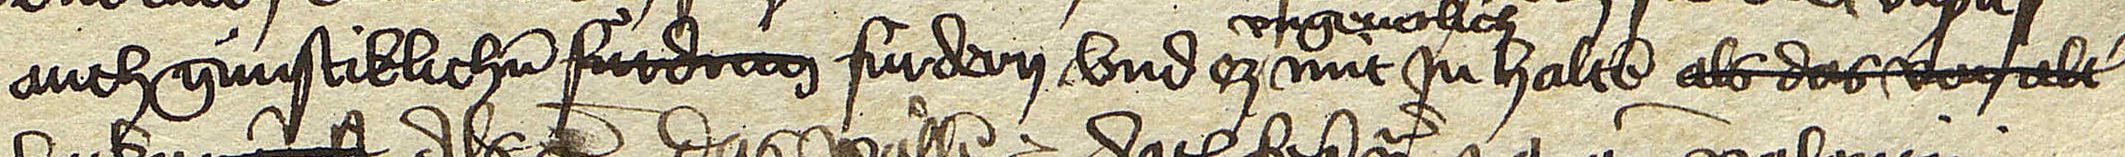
auch günſtiklichn* fürdrug fürdern / vnd eʒ mit In halte* als das von alt*
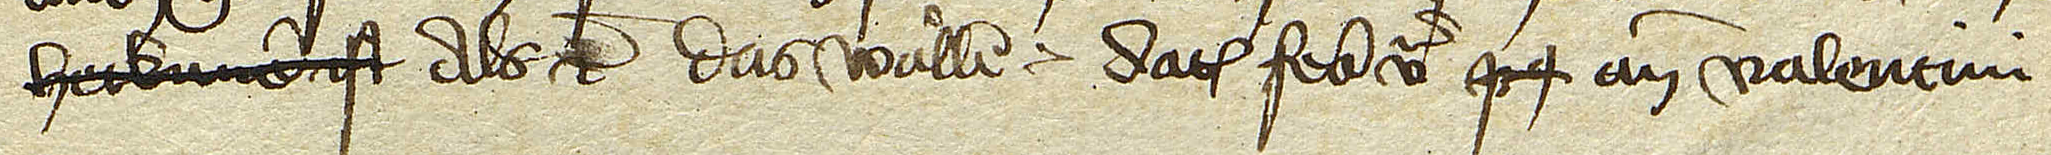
herkume* iſt Als ec* das wölle* ~ dat* fea* v* p* an* valentini
